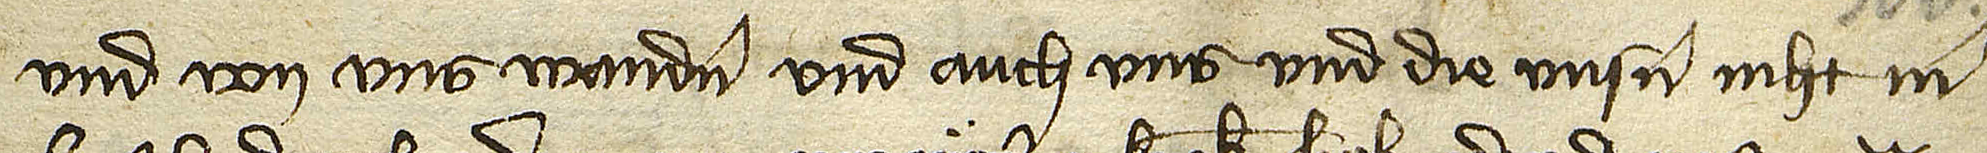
vnd von vns wand*n vnd auch vns vnd die vnſ*n niht m*
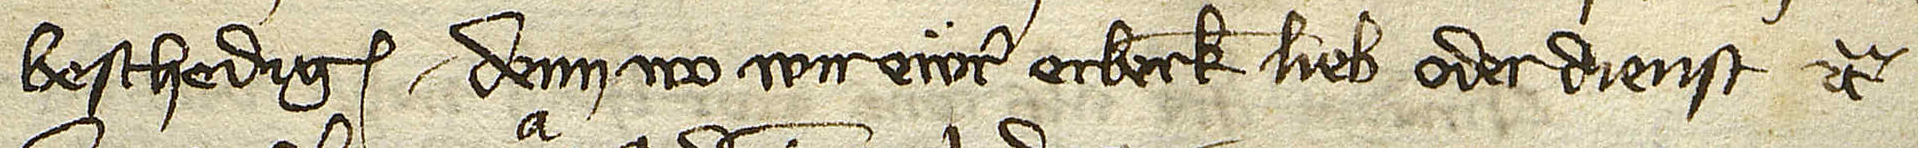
beſchedig* / Denn wo wir eẅr* erberk* lieb oder dienſt ec*
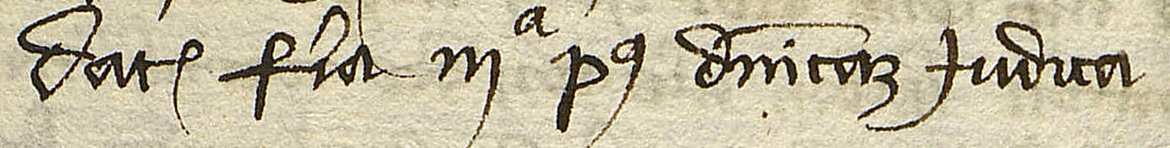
Dat* f*ia iii* p* dnica* Iudica
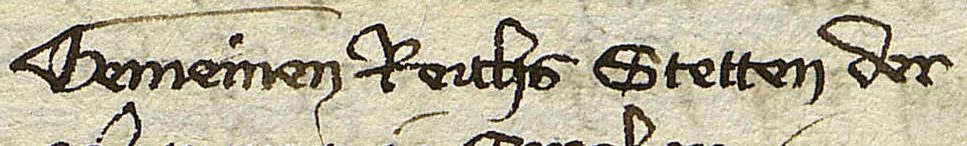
Gemeinen Reichs Stetten der
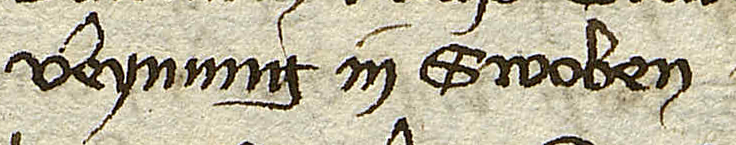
v*eynung in Swoben
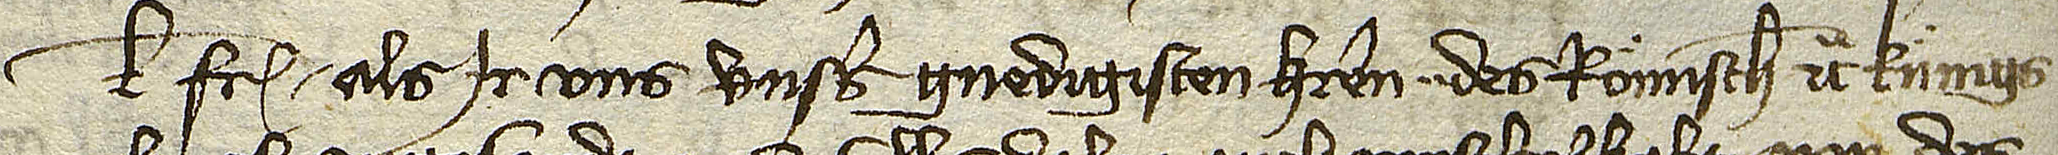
L* fr* / als Ir vns vnſ*s gendigiſten h*ren ~ des Römiſch* ec* Künigs
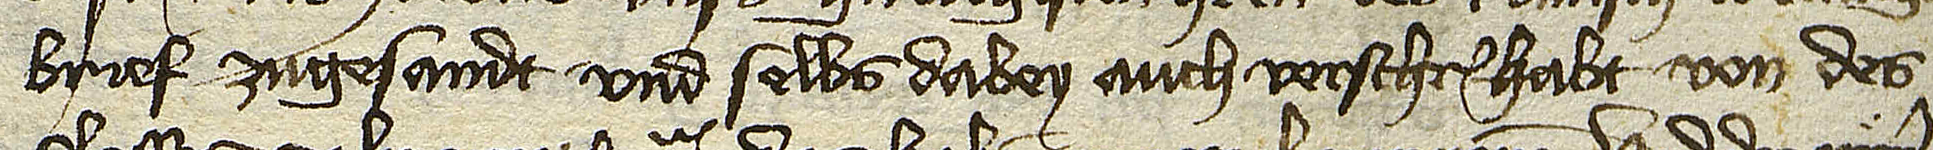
brief ʒugeſandt / vnd ſelbs dabey auch verſchr* habt von des
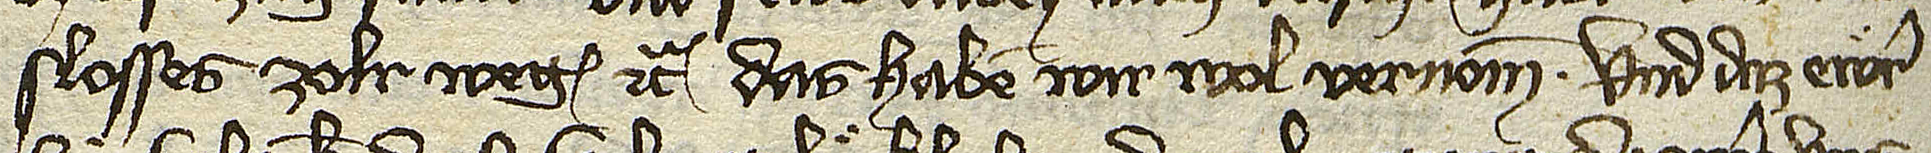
ſloſſes ʒolr weg* ec* das habe* wir wol vernom* . Vnd daʒ eẅr*
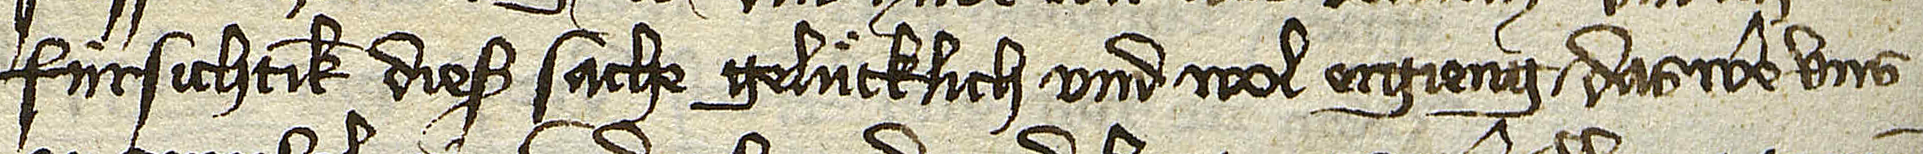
fürſichtik* dieſ* ſache gelücklich vnd wol ergieng / das we* vns
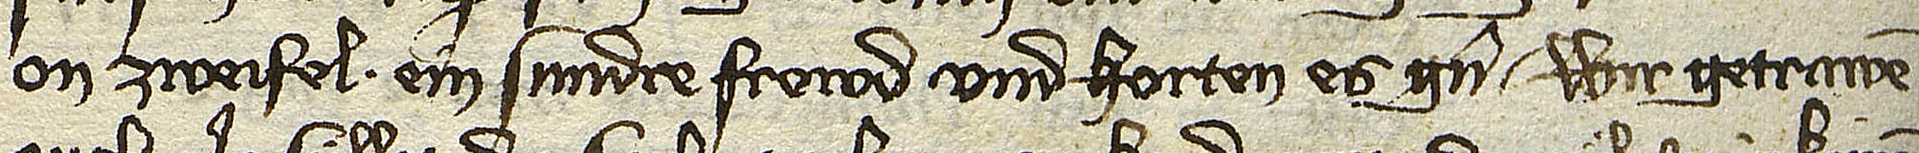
on ʒweifel . ein ſundre frewd vnd horten es g*n / Wir getrawe*
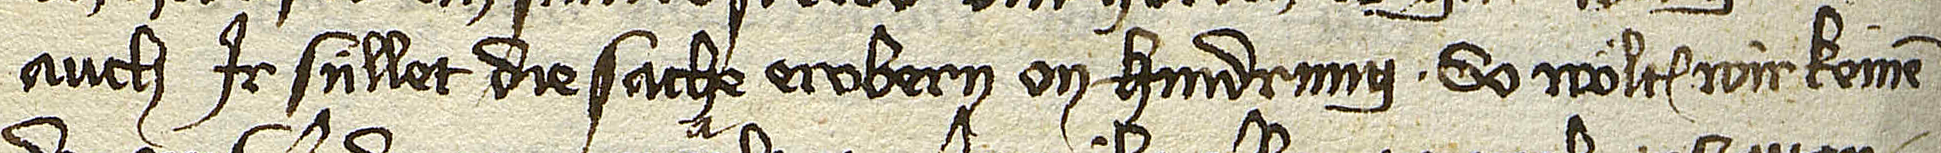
auch Ir ſüllet die ſache erobern on hindrung . So wölt* wir keine*
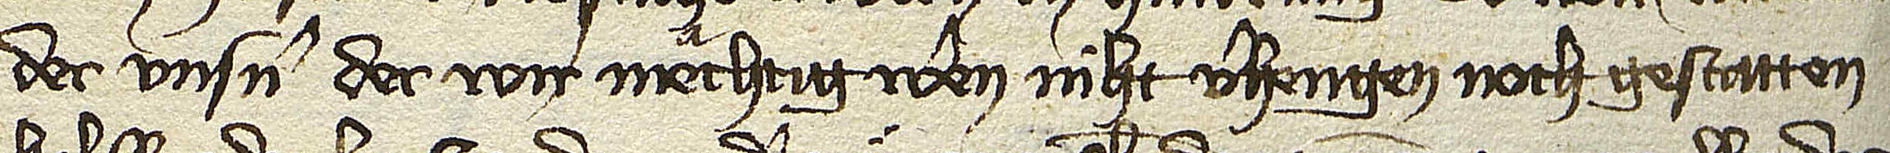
der vnſ*n der wir mëchtig w*en niht v*hengen noch geſtatten
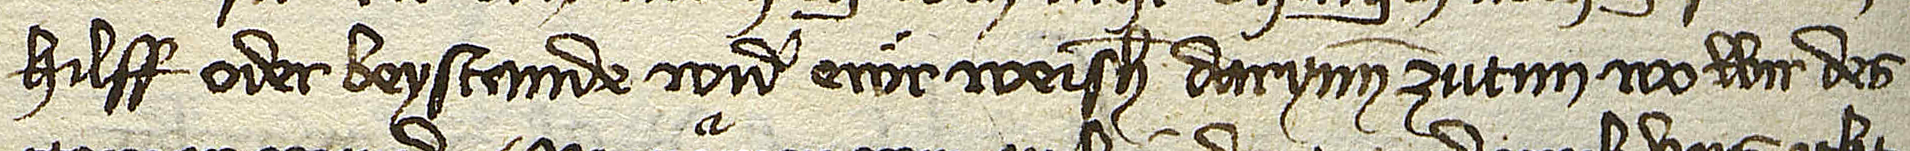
hilff oder beyſtande wid* eẅr weiſh* darynn* ʒutun wo wir des
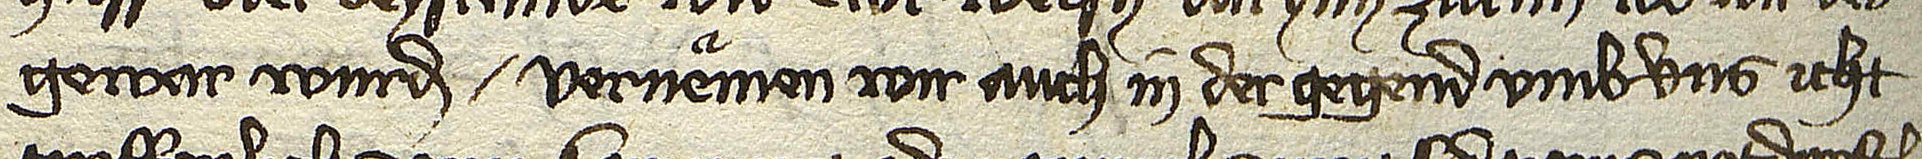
gewar wurd* / vernëmen wir auch in der gegend vmb vns icht
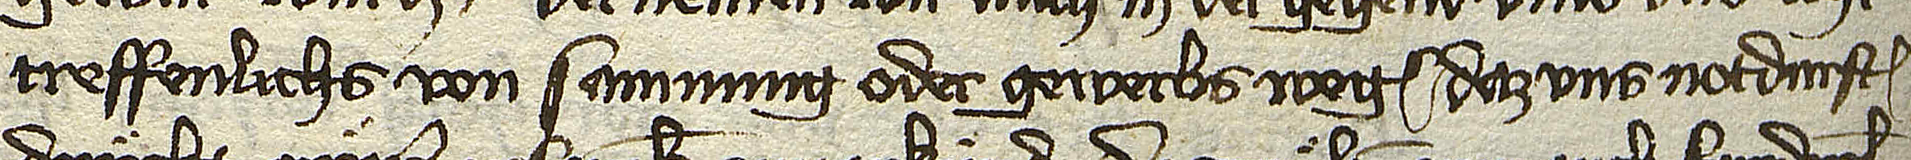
treffenlichs von ſammung oder gewerbs weg* daʒ vns notdurft*
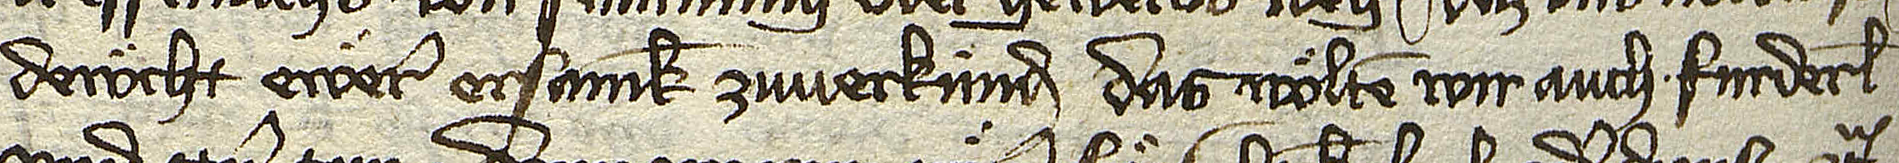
deẅcht eẅer* erſamk* ʒuuerkünd* das wölte wir auch furderl*
